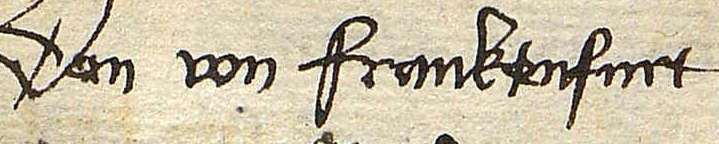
Den von Frankenfurt
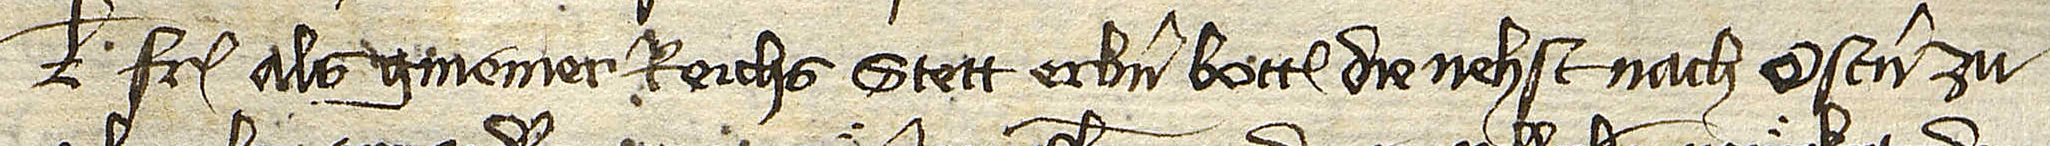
L* fr* als gmeiner Reichs Stett erbn* bott* die nehſt nach Oſtn* ʒu
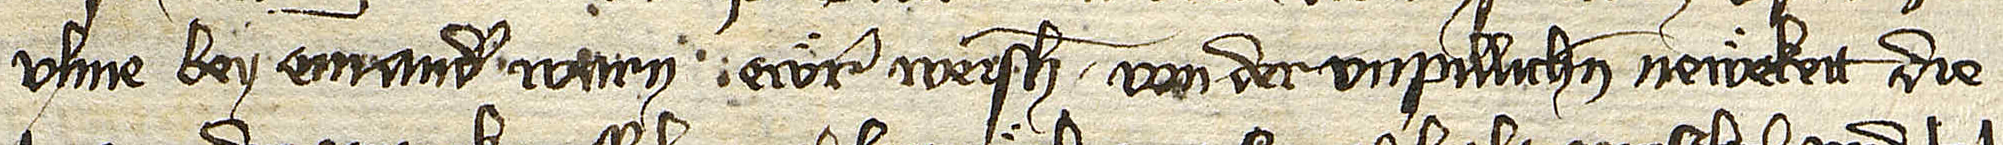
vlme bey einand* warn eẅr* weiſh* / von der vnpillichn* neẅekeit die
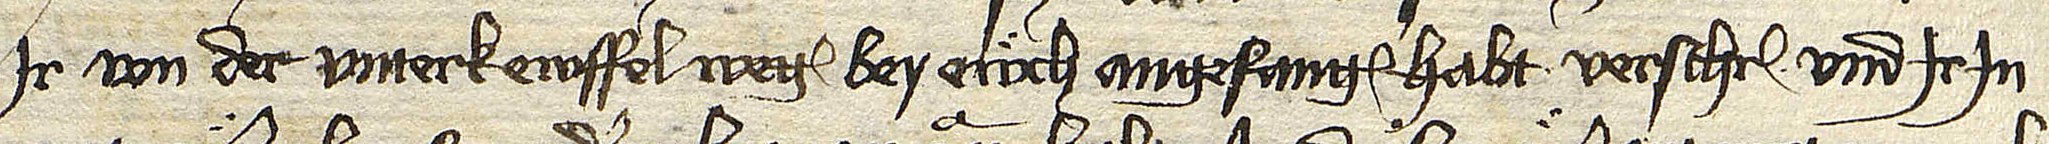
Ir von der vnterkewffel weg* bey eẅch angefang* habt verſchr* vnd Ir In
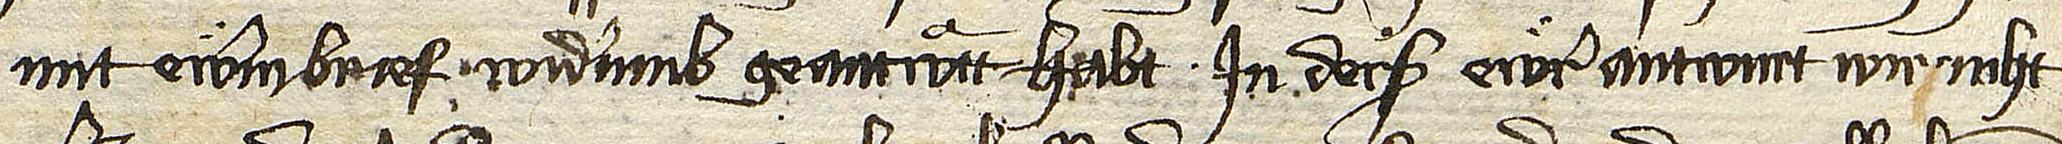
mit eẅ*m brief wid*umb geantw*t habt . In derſ* eẅr* antwurt wir niht
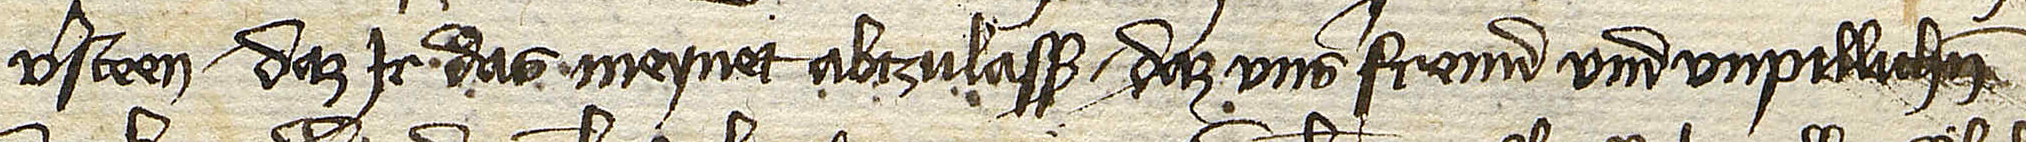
v*ſteen / daʒ Ir das meynet abcʒulaſſ* / daʒ vns fremd vnd vnpillichn*
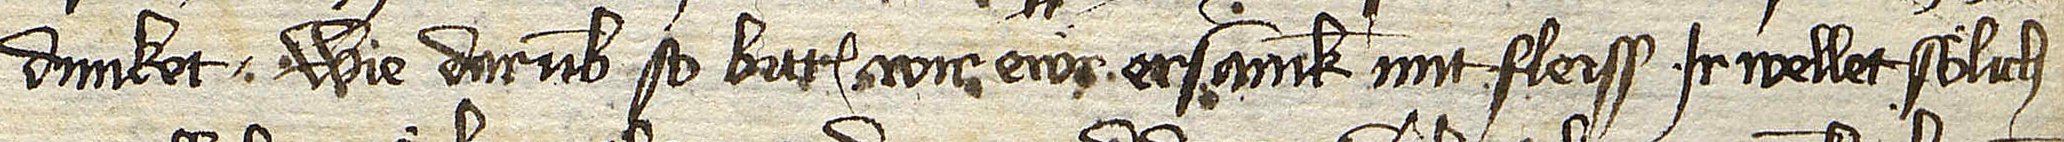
dunket / Wie darub* ſo bitt* wir eẅr erſamk* mit fleiſſ Ir wellet ſölich
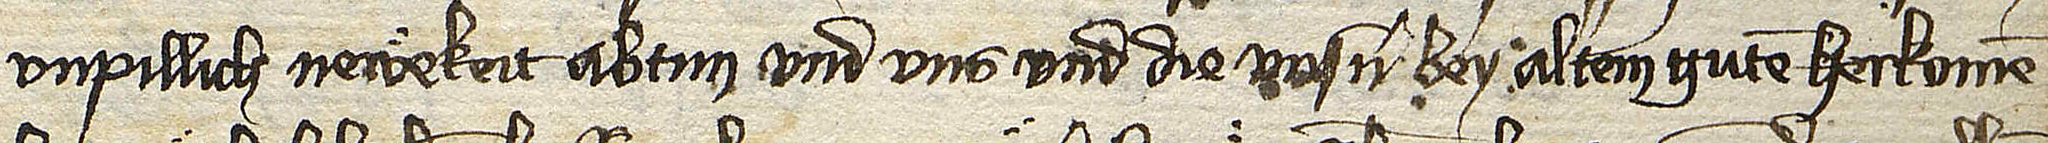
vnpillich neẅekeit abtun vnd vns vnd die vnſn* bey altem gute* herkome*
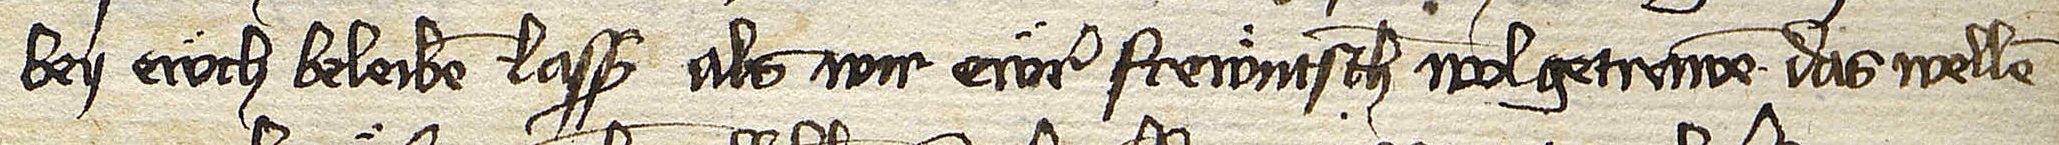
bey eẅch beleibe* laſſ* als wir eẅr* freẅntſch* wol getrawe* . das welle*
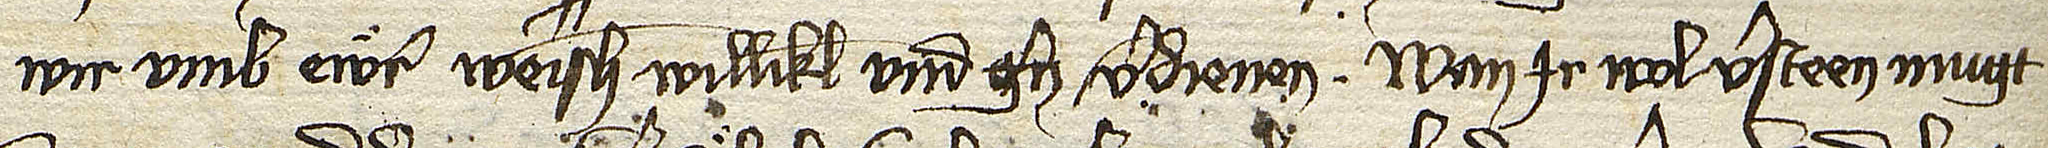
wir vmb eẅr* weiſh* willikl* vnd g*n v*dienen . Wan Ir wol v*ſteen mugt
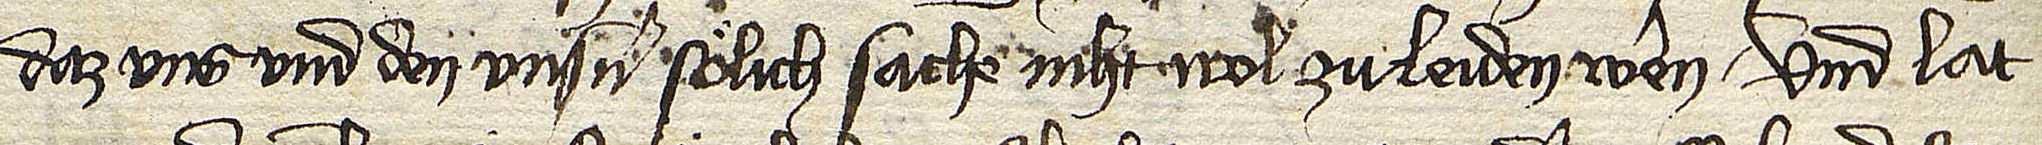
daʒ vns vnd den vnſn* ſölich ſache niht wol ʒuleiden w*en / Vnd lat
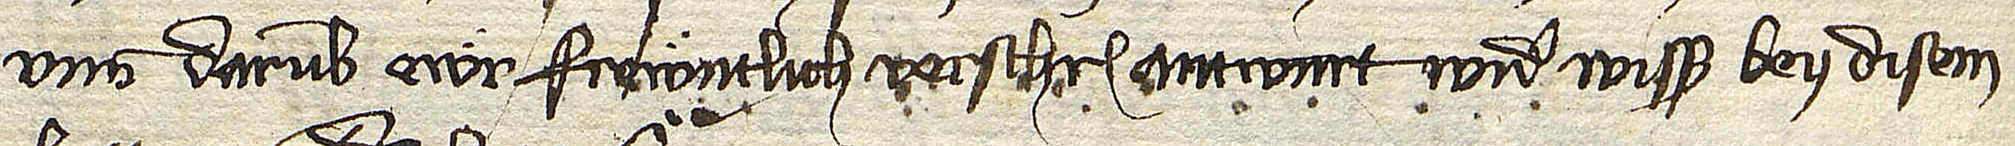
vns darub* eẅr freẅntlich verſchr* antwurt wid* wiſſ* bey diſem
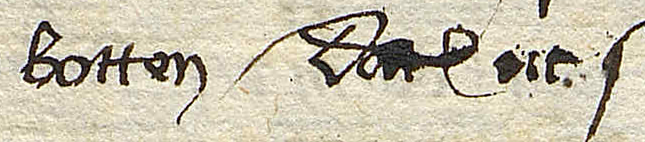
botten / Dat* ut ſ*
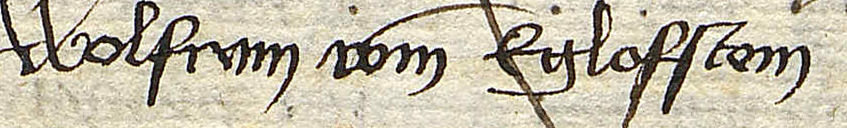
Wolfram vom* Eglofſtein
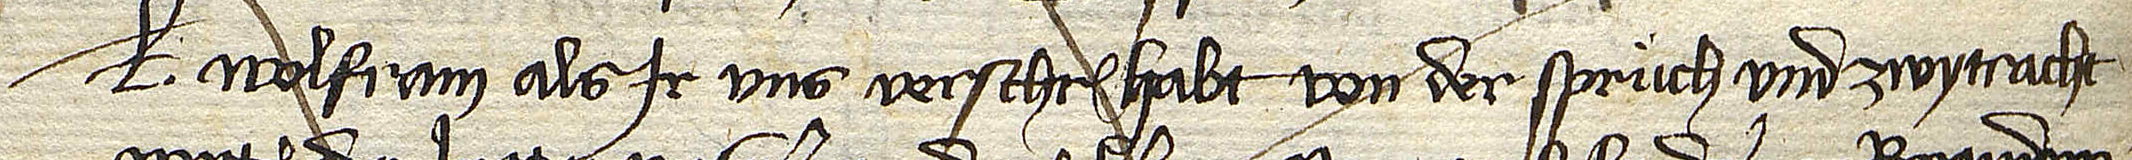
L* wolfram als Ir vns verſchr* habt von der ſprüch vnd ʒwytracht
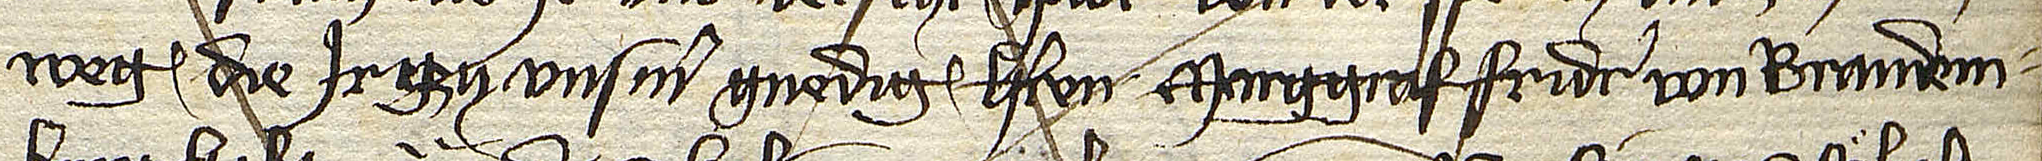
weg* / die Ir ʒu vnſm* gnedig* h*ren / Marggraf fridr* von Brandem =
